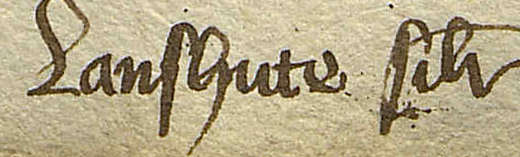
Lanſhute ſilr*
